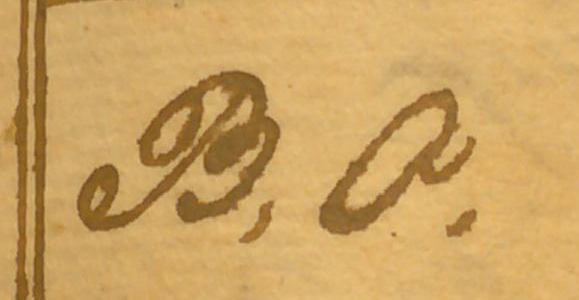B. O.
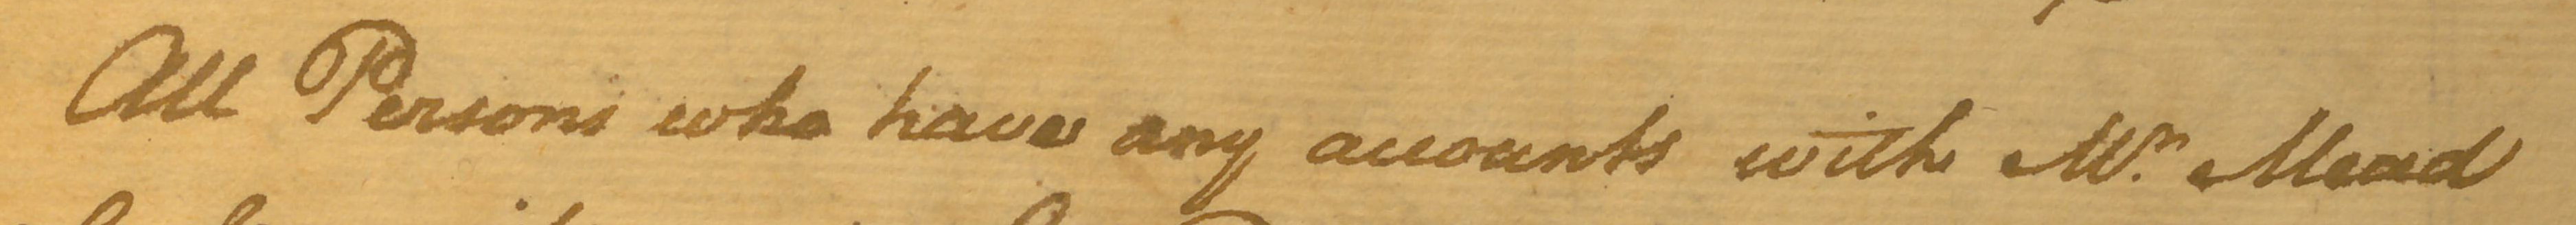All Persons who have any accounts with M^r. Mead
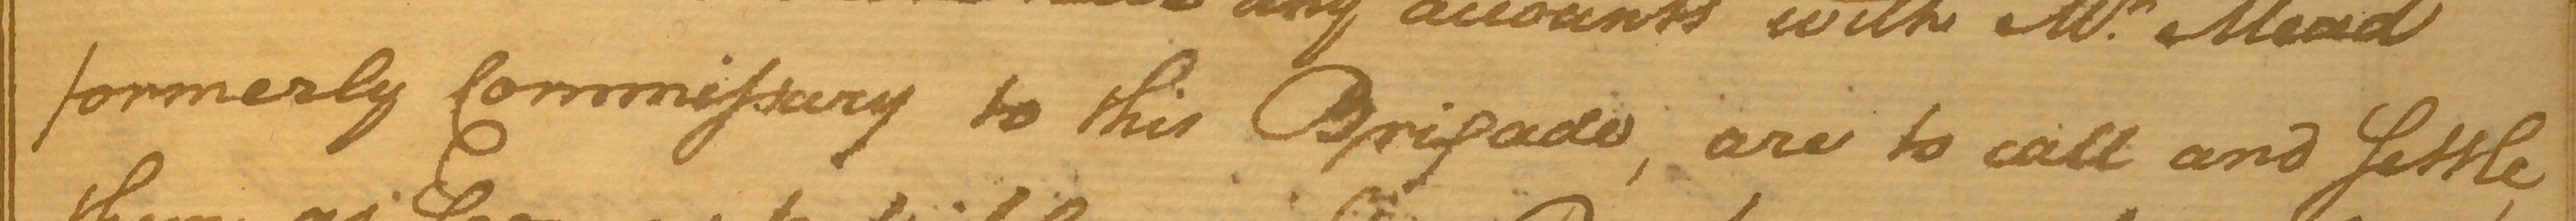formerly Commissary to this Brigade, are to call and settle
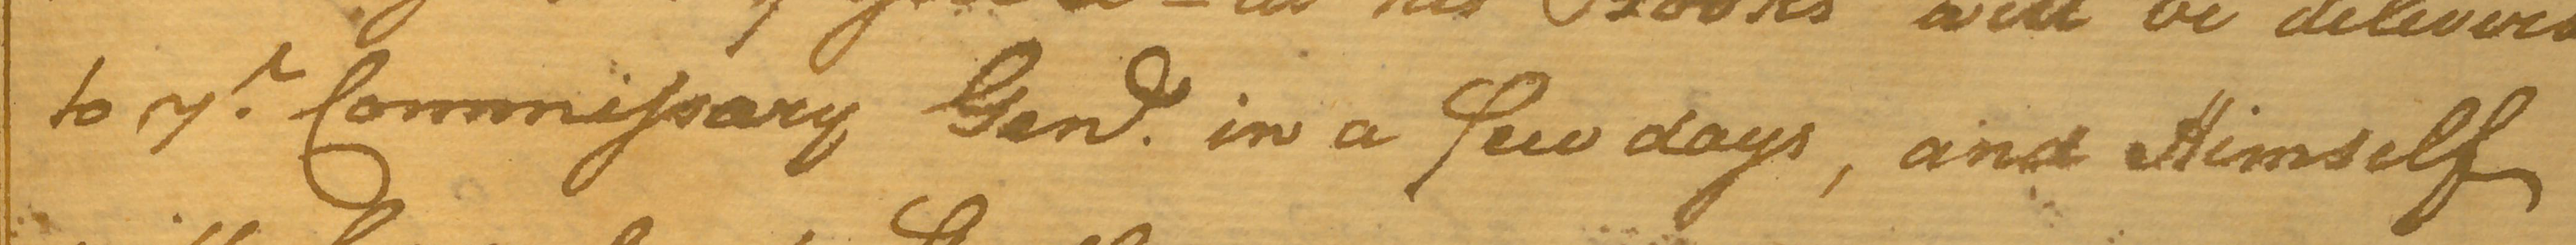to y^e. Commissary Gen^l. in a few days, and Himself
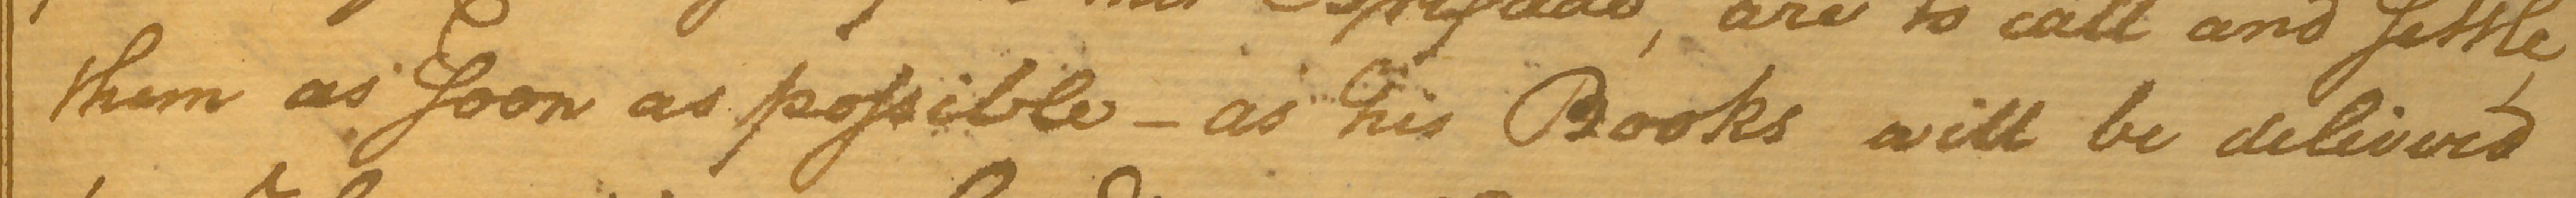them as soon as possible- as his Books will be deliver'd
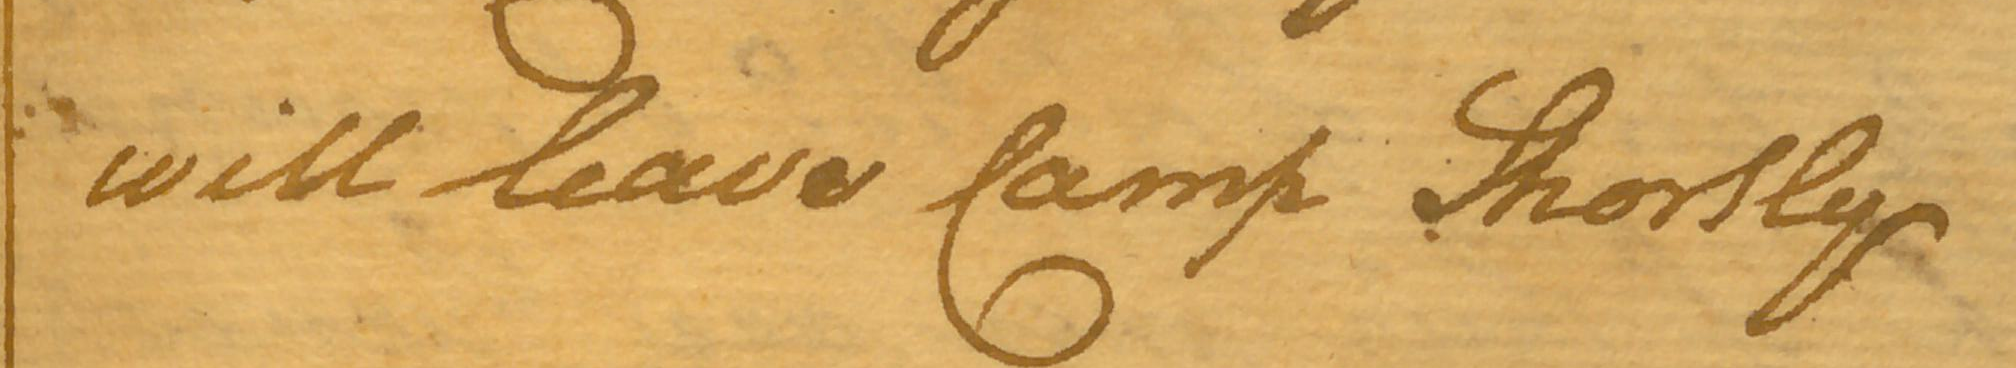will leave Camp shortly
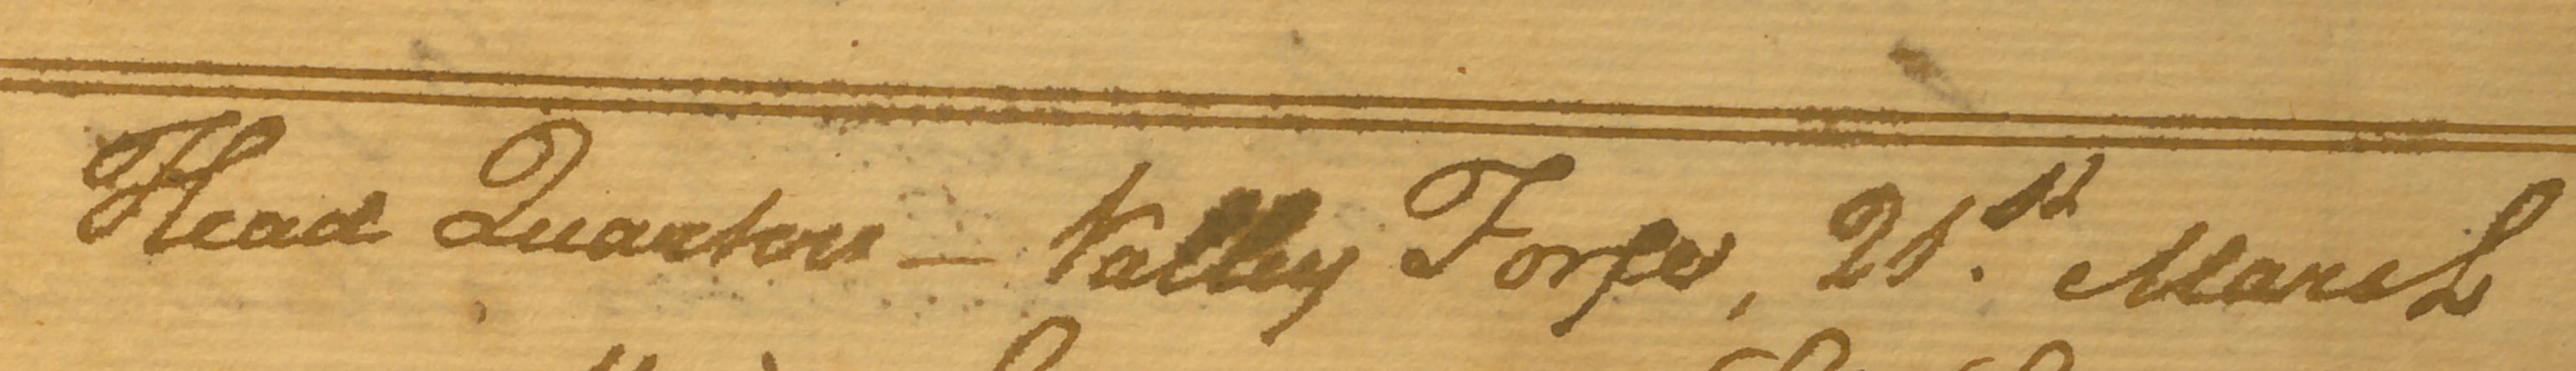Head Quarters- Valley Forge, 21^st. March
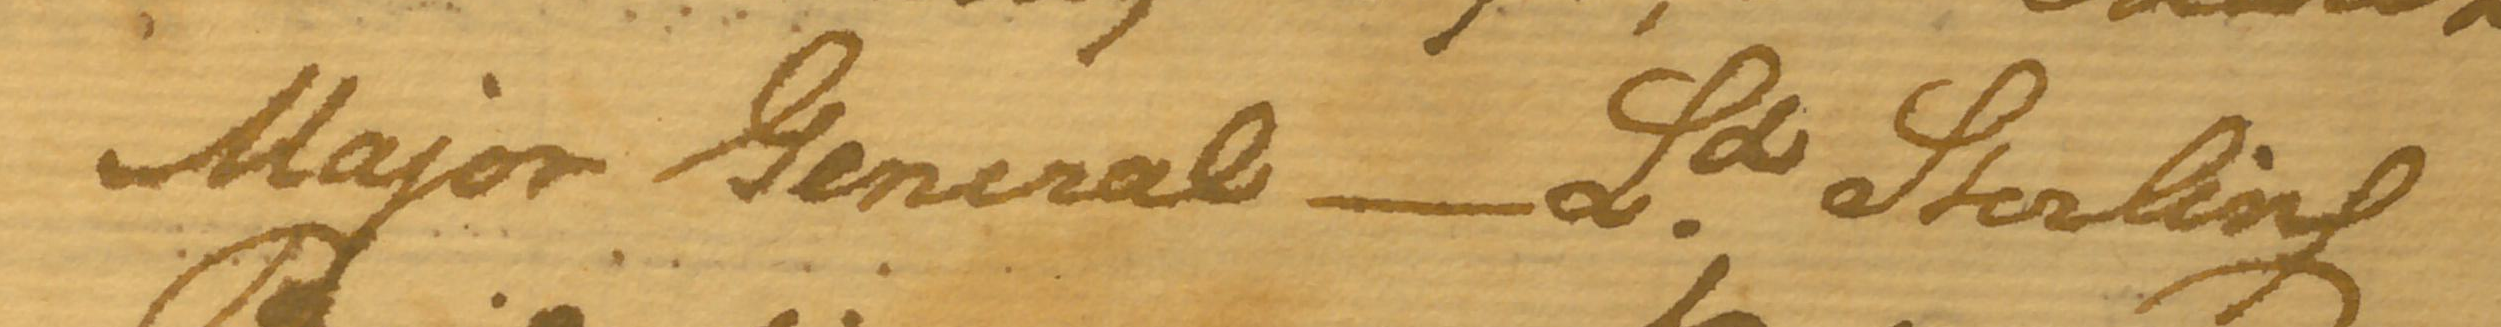Major General- L^d. Sterling
